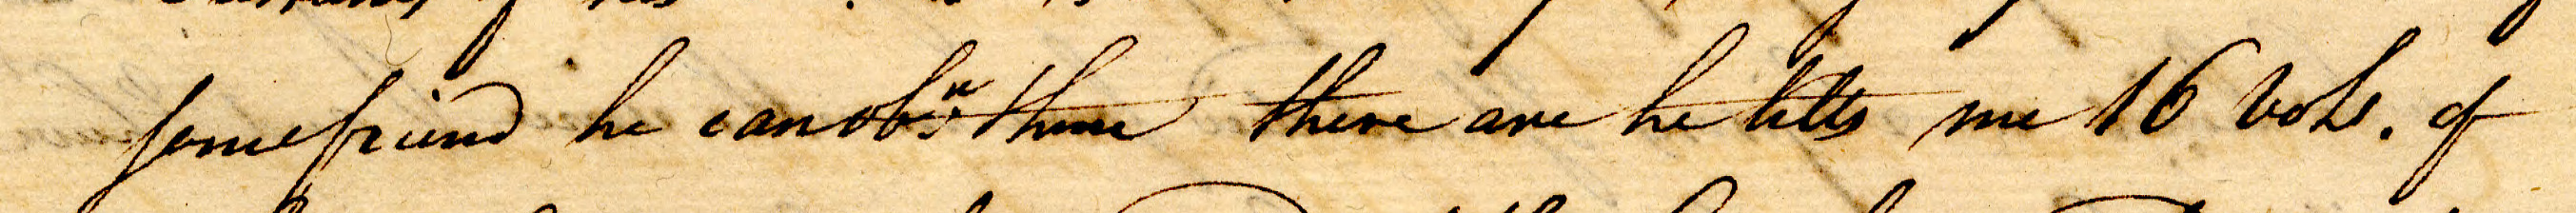some friend he can ob^t. those there are he tells me 16 vols. of
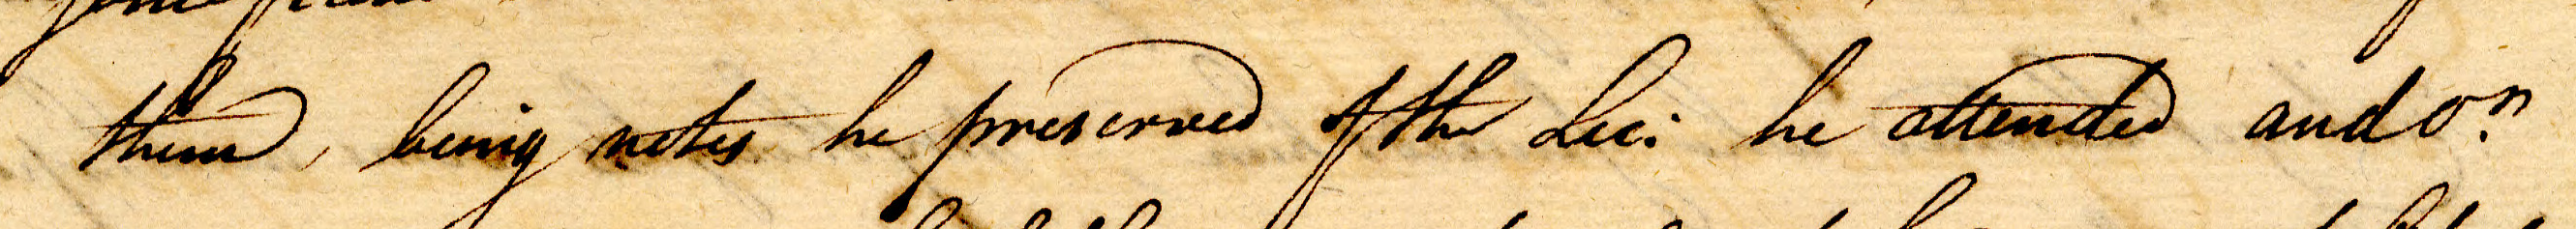them, being notes he preserved of the Lec: he attended and o^r.
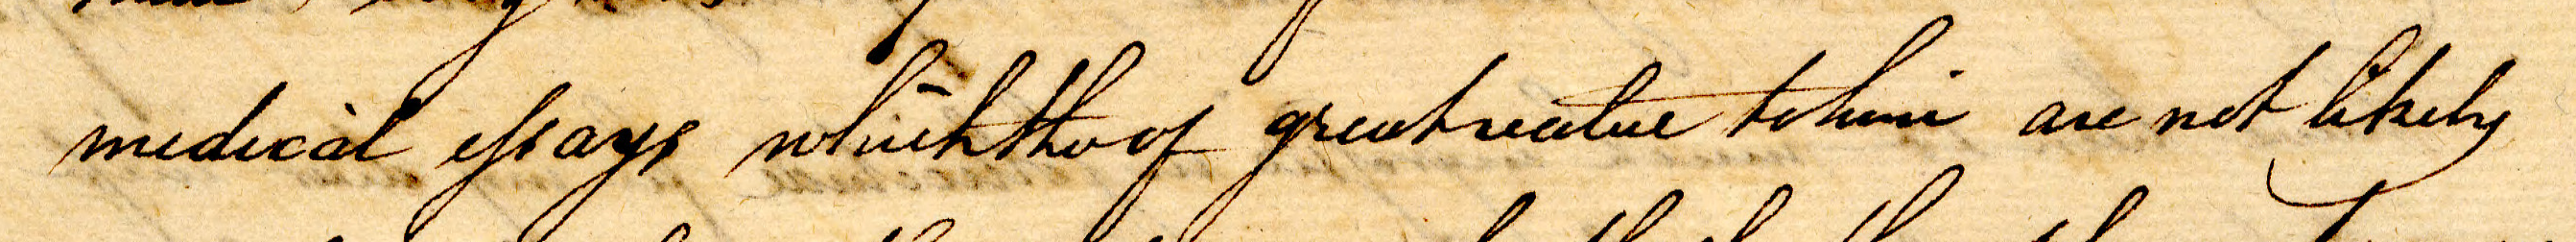medical essays which tho of great value to him are not likely
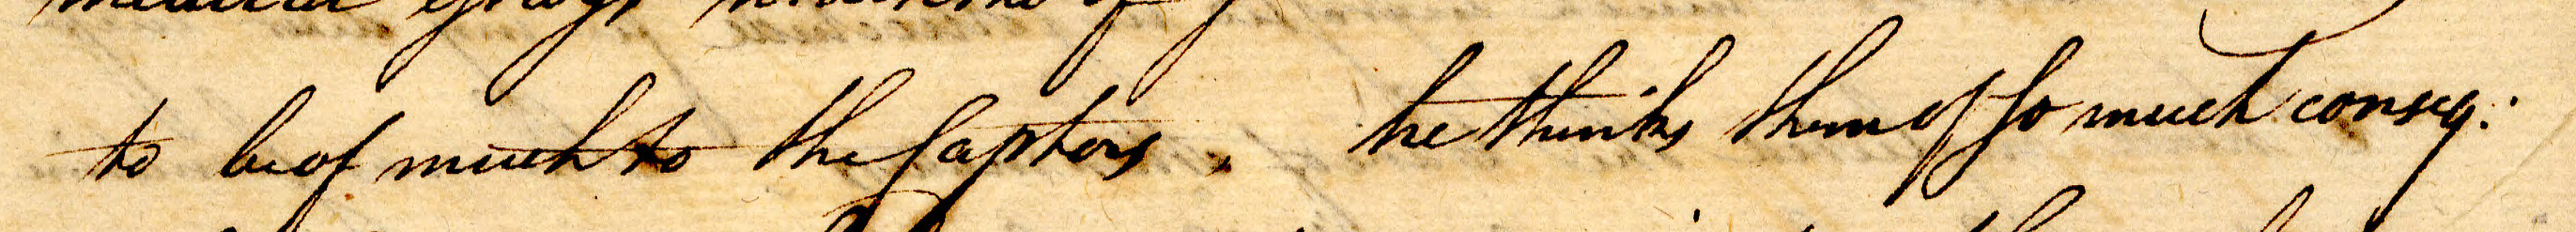to be of much to the Captors. he thinks them of so much conseq.
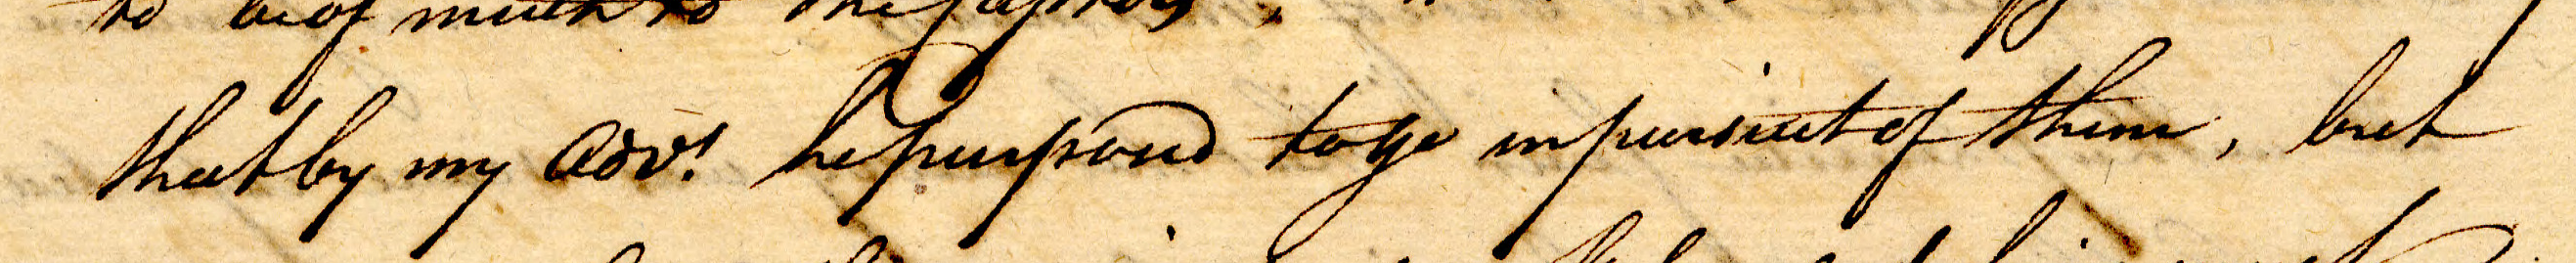that by my Adv^t. he purposed to go in pursuit of them, but
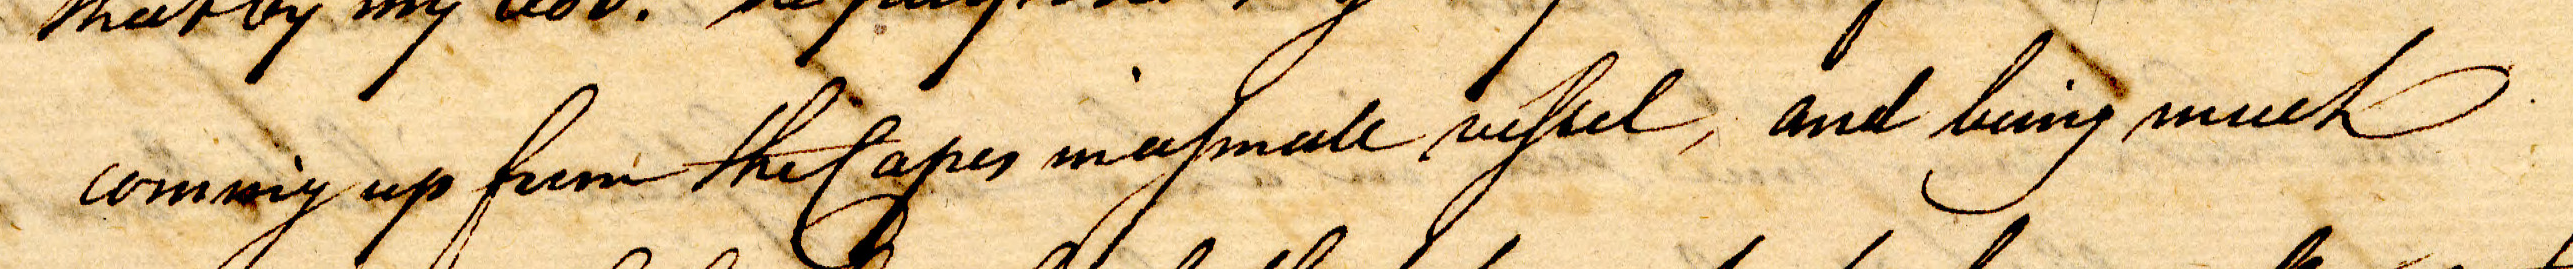coming up from the Capes in a small vessel, and being much
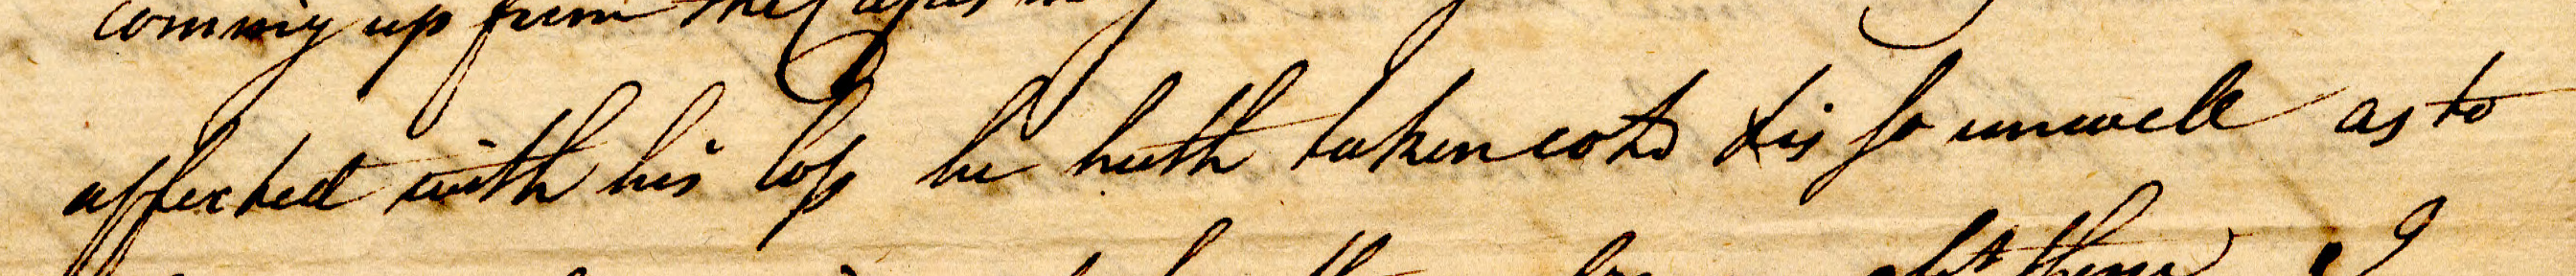affected with his loss he hath taken cold & is so unwell as to
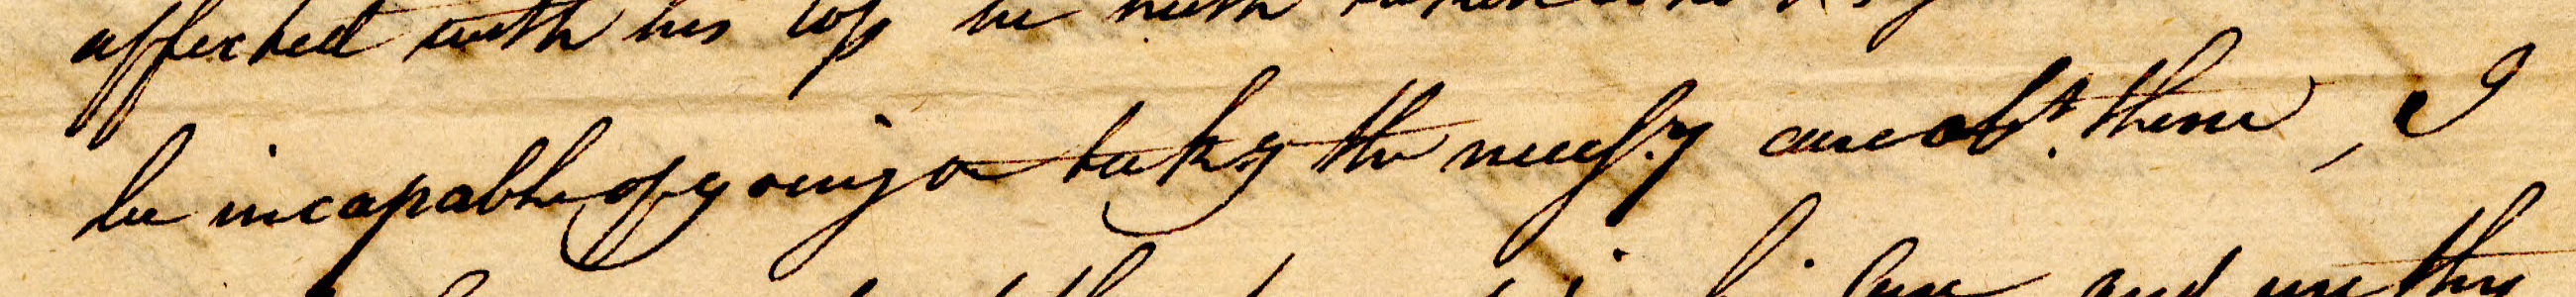be incapable of going or tak^g. the neces^y. care ab^t. them, I
